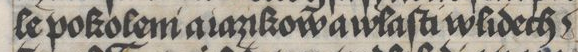le pokolení a iazikow a wlaſti wlidech
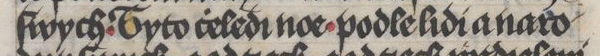ſwych.Tyto ċeledi noe.podle lidi a naro¬
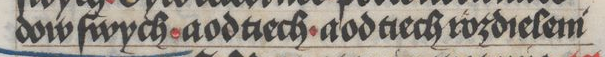dow ſwych.a od tiech.a od tiech rozdieleni
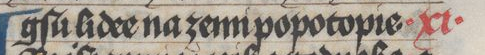gſu lidee na zemi popotopie.xi.
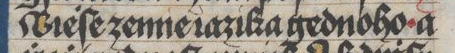Bieẛe zemie iazika gednoho.a
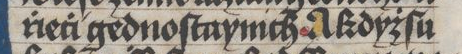ṙieċí gednoſtaynich.A kdyż ſu
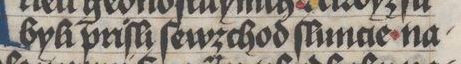byli pṙiẛli ſewzchod ſluncie.na¬
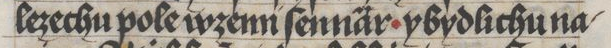lezechu pole wzemí ſennar.ybydlichu na¬
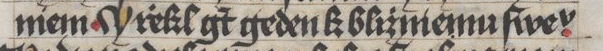niem.Y ṙekl ḡt geden k bliżníemu ſwev
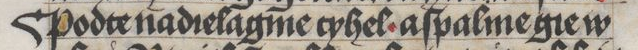Podte nadielagme cyhel.a ſpalnie gie w
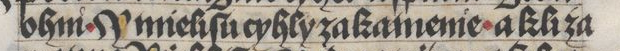ohni.Y mieliſu cyhly zakamenie.a kli za
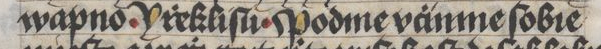wapno.Yṙekli ſu.Podme vċinmie ſobie
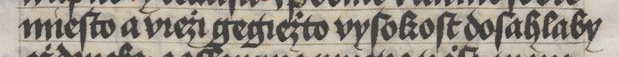míeſto a vieżi gegíeżto vyſokoſt doſahlaby
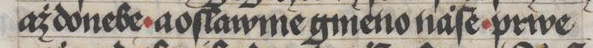aż donebe.a oſlawnie gmeno naẛe.prwe
